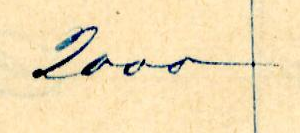2000
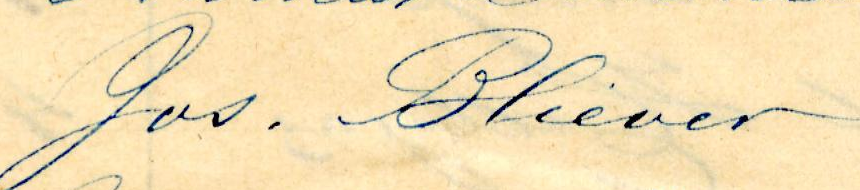Jas. Bliever
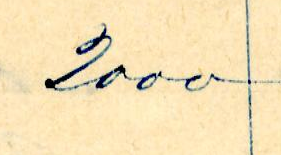2000
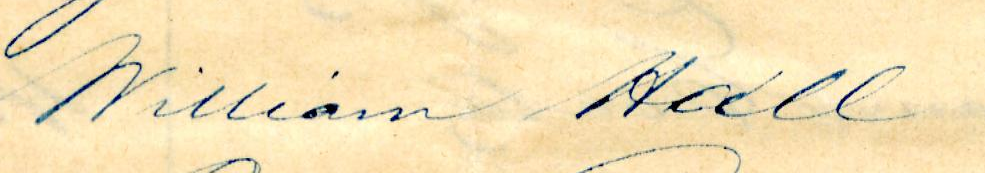William Heell
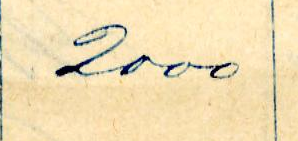2000
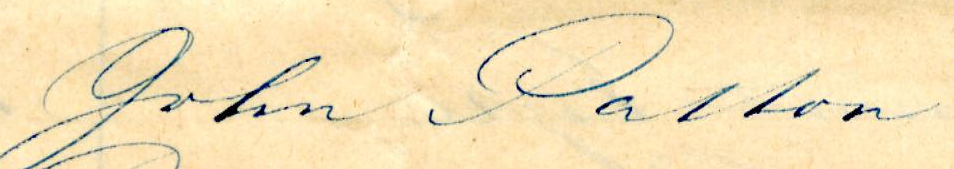John Patton
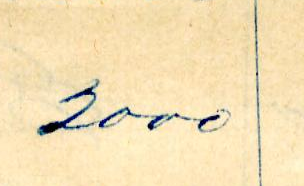2000
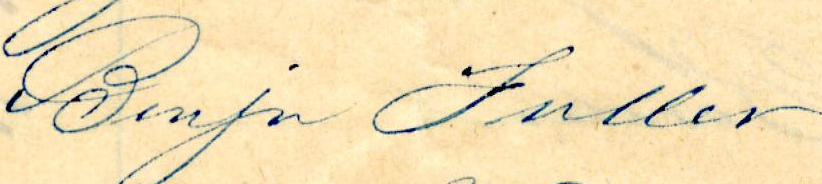Benjn Fuller
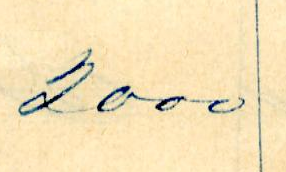2000
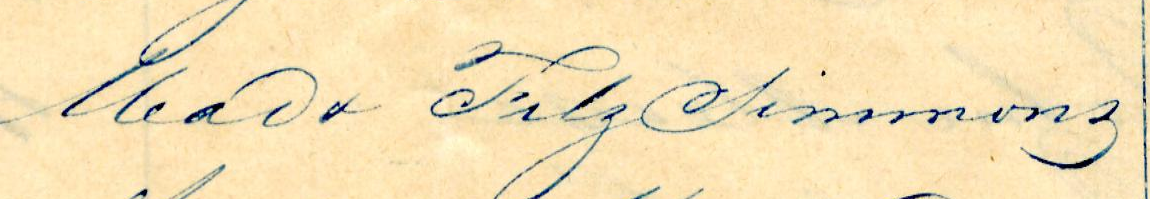Mead & Fitz Simmons
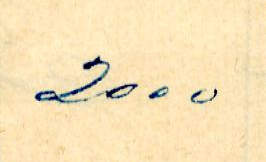2000
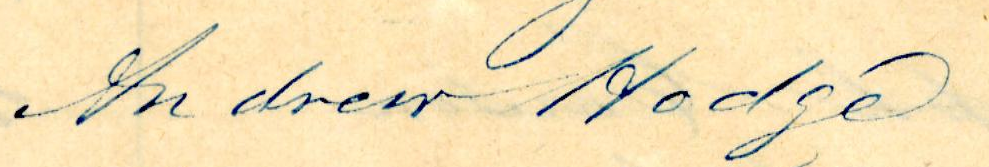Andrew Hodge
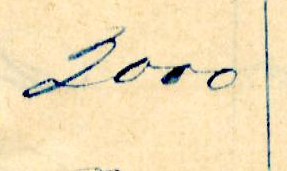2000
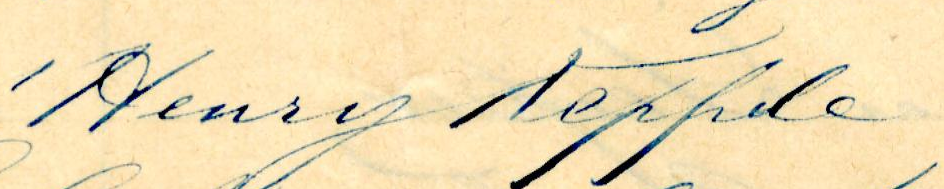Henry Kepple
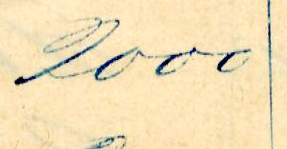2000
